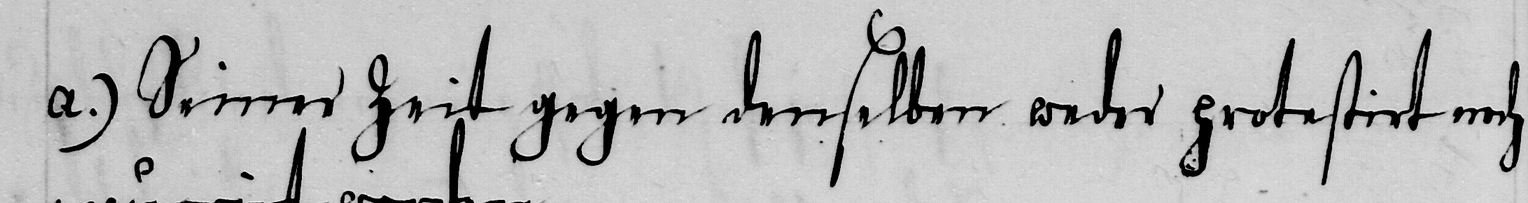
a.) Seiner Zeit gegen denselben weder protestirt n¬
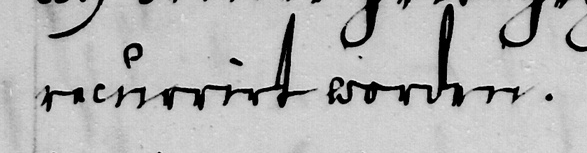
recurrirt worden.
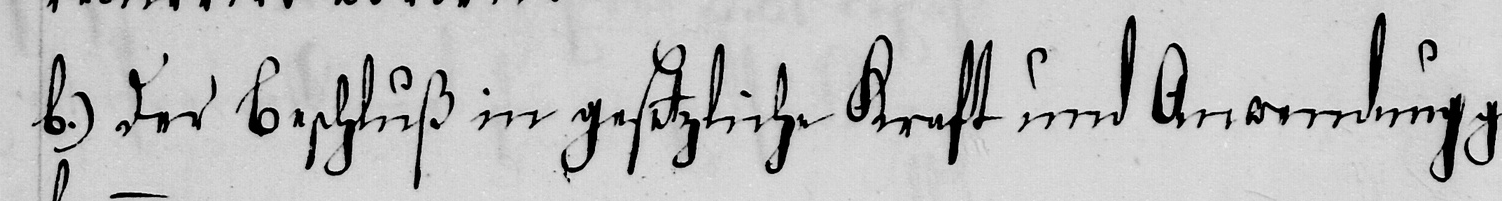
b.) Der Beschluß in gesetzliche Kraft und Anwendung
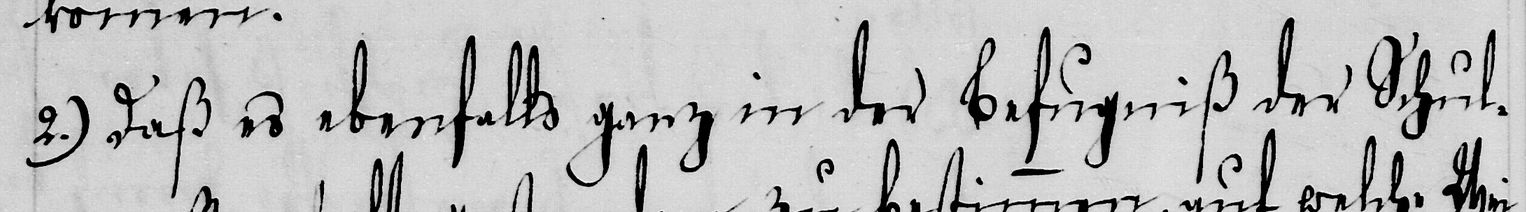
2.) Daß es ebenfalls ganz in der Befugniß der Schul¬
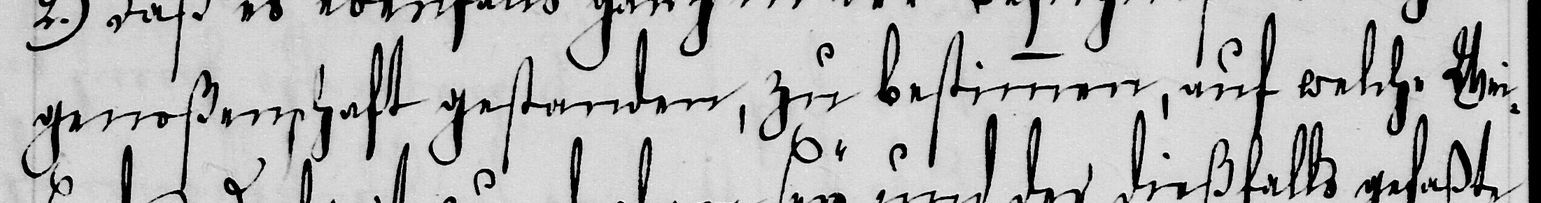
genoßenschaft gestanden, zu bestimmen auf welche Wei¬
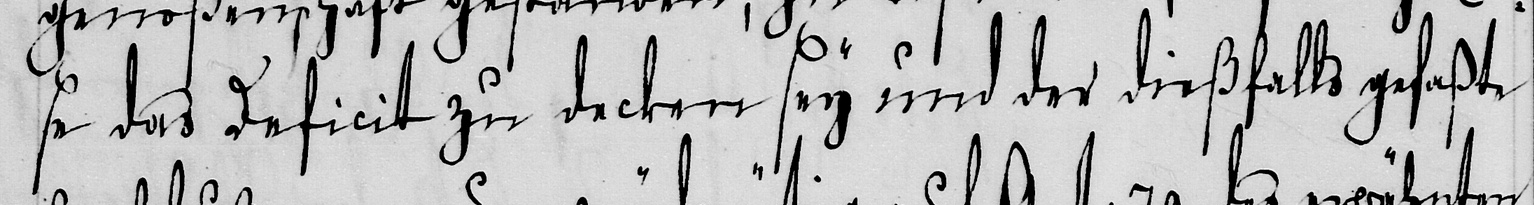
se das Deficit zu decken sey und der dießfalls gefaßte
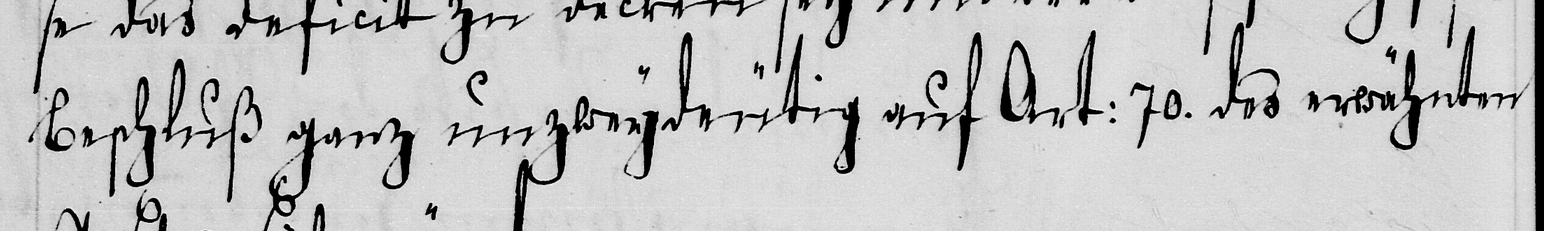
Beschluß ganz unzweydeutig auf Art: 70. des erwähnten
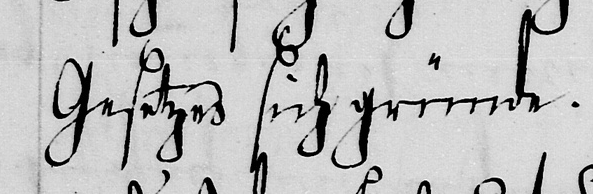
Gesetzes sich gründe.
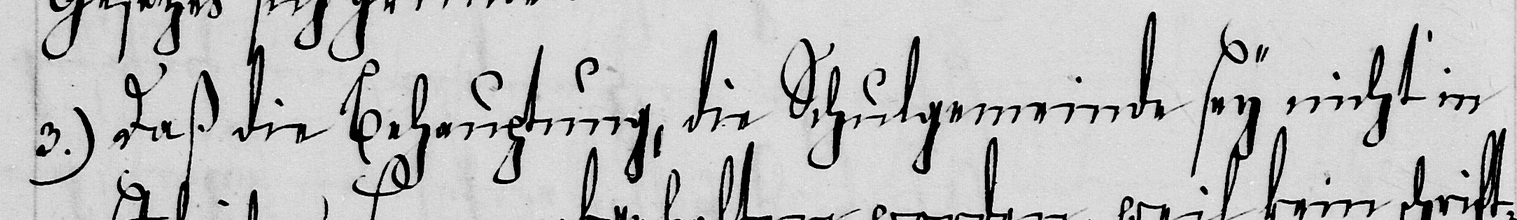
3.) Daß die Behauptung, die Schulgemeinde sey nicht in
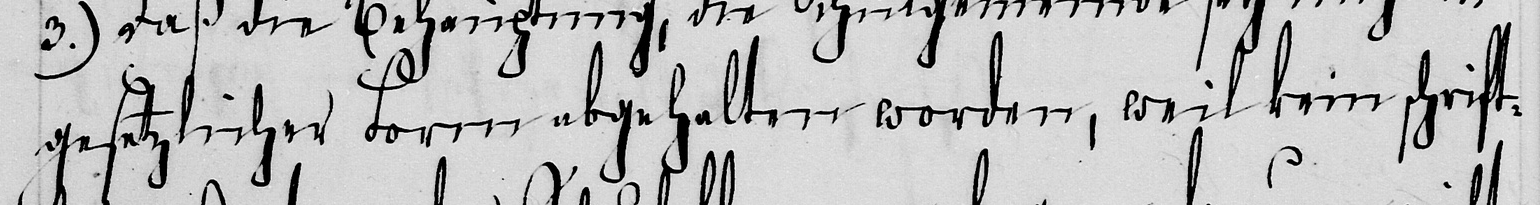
gesetzlicher Form abgehalten worden, weil kein schrift¬
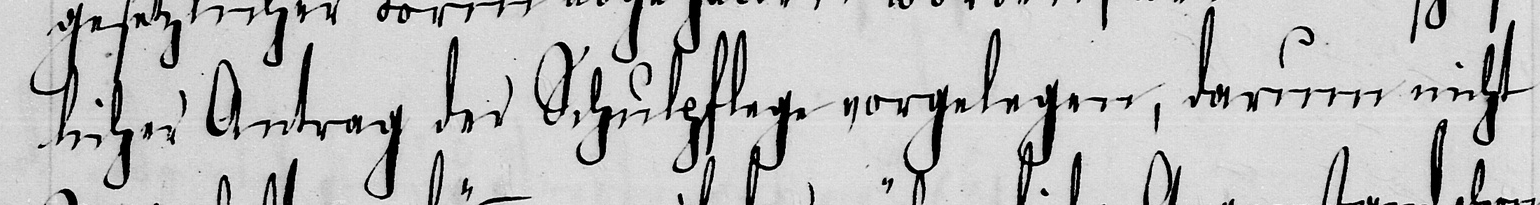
licher Antrag der Schulpflege vorgelegen, darum nicht
